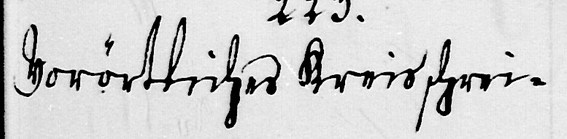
vorörtliches Kreisschreib¬
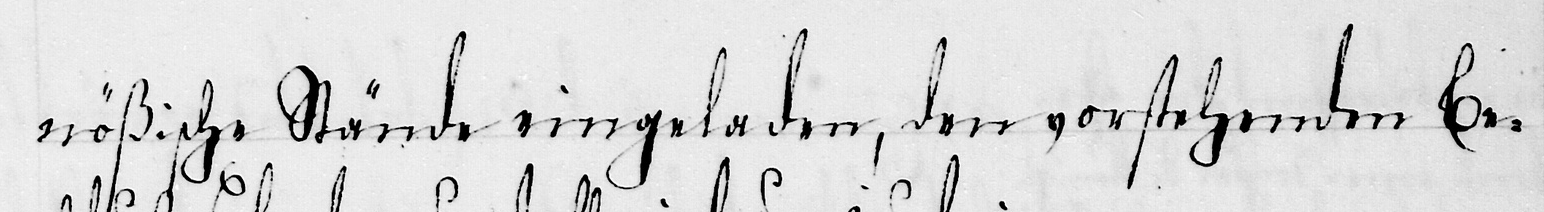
nößische Stände eingeladen, den vorstehenden Be¬
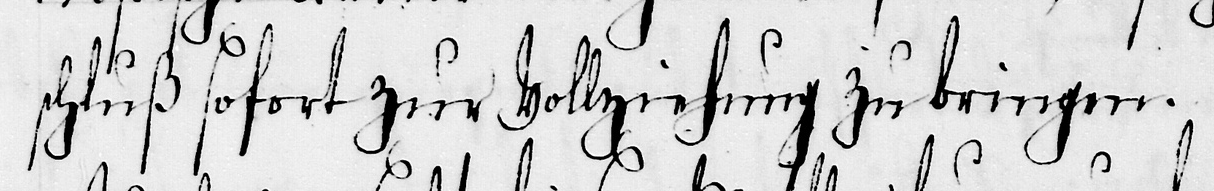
schluß sofort zur Vollziehung zu bringen.
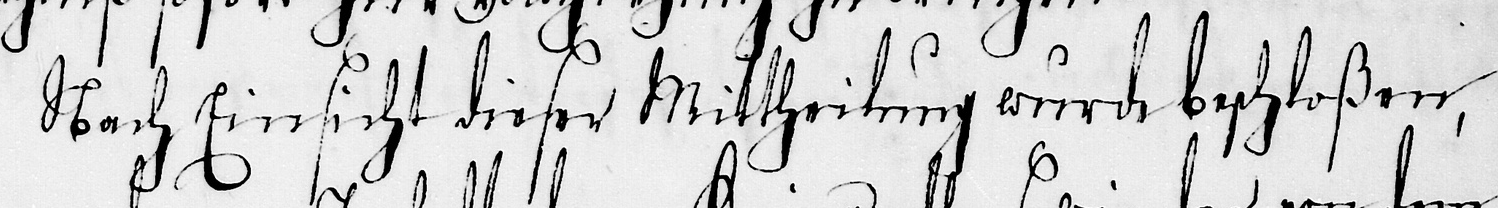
Nach Einsicht dieser Mittheilung wurde beschloßen,
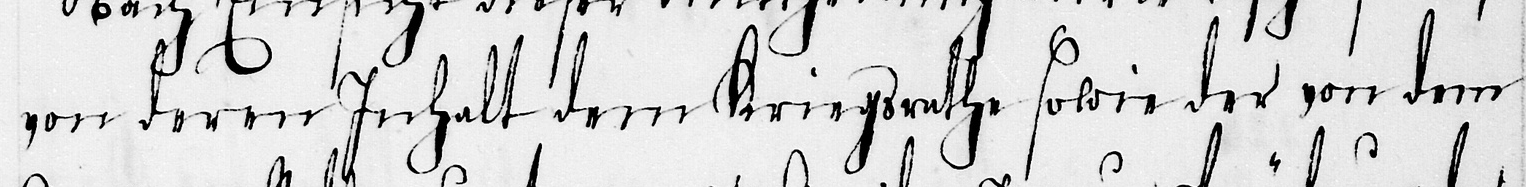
von deren Inhalt dem Kriegsrathe sowie der von dem
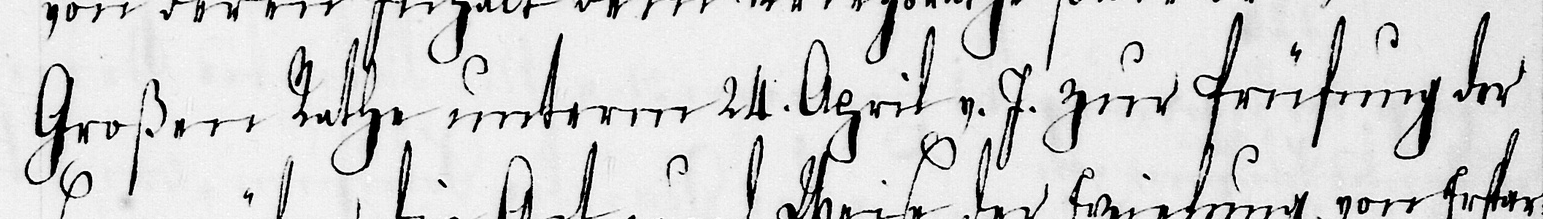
Großen Rathe unterm 24. April v. J. zur Prüfung der
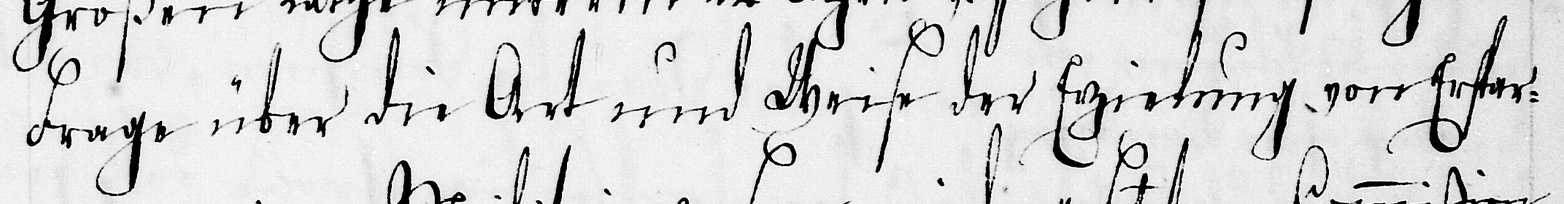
Frage über die Art und Weise der Erzielung von Erspar¬
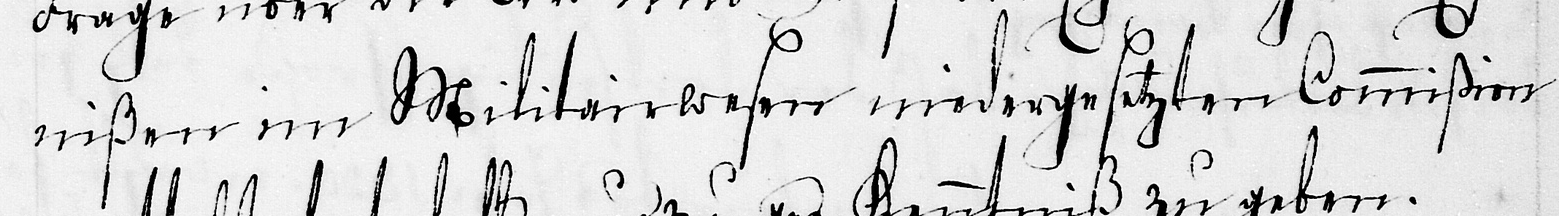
nißen im Militärwesen niedergesetzten Commißion
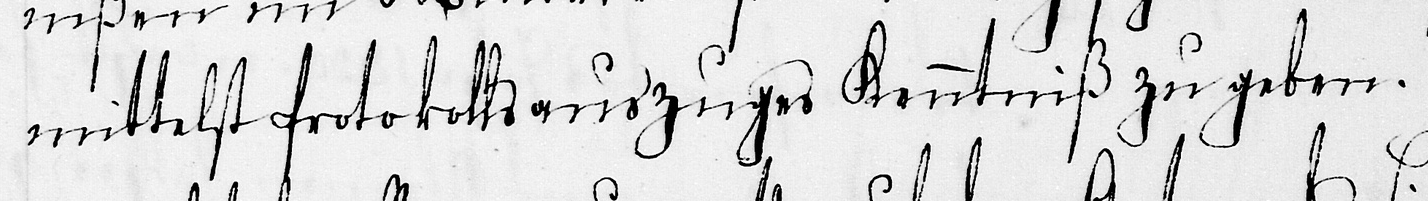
mittelst Protokollsauszuges Kenntniß zu geben.
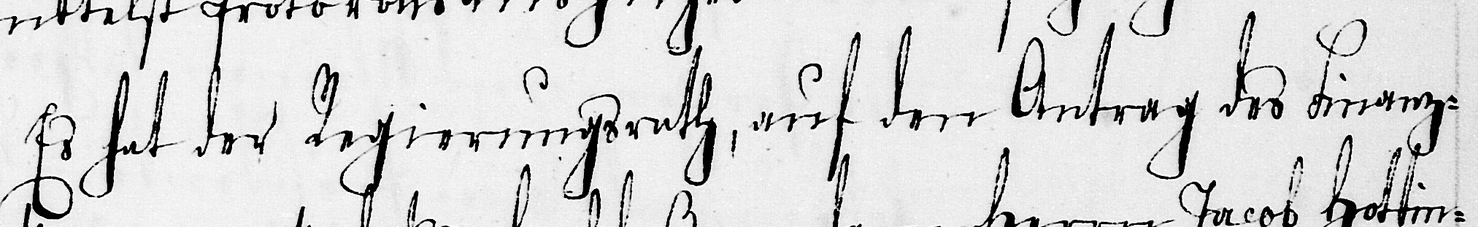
Es hat der Regierungsrath, auf den Antrag des Finanz¬
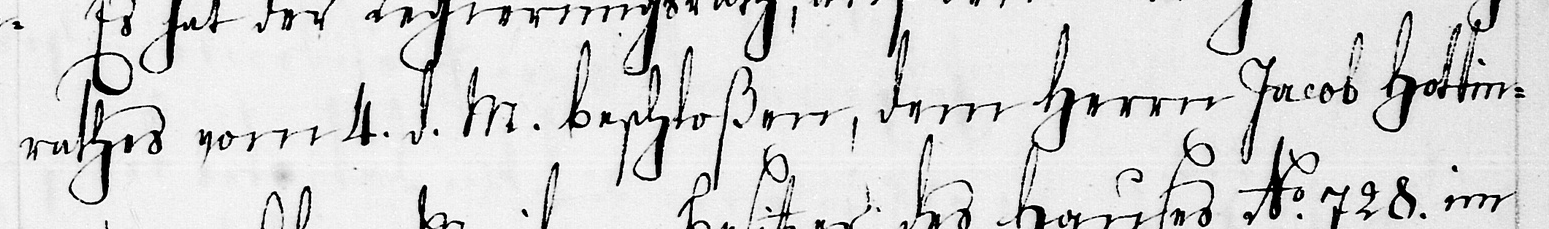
rathes vom 4. d. M. beschloßen, dem Herrn Jacob Hottin¬
